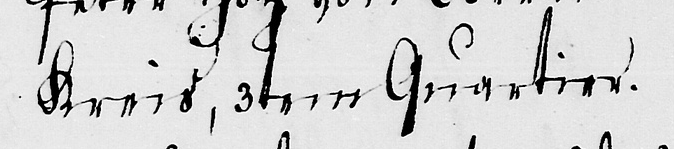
Kreis, 3ten Quartier.
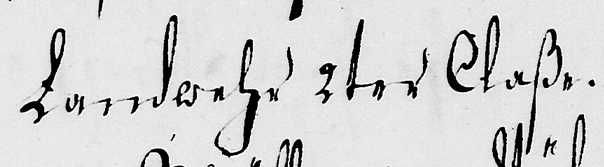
Landwehr 2ter Claße.
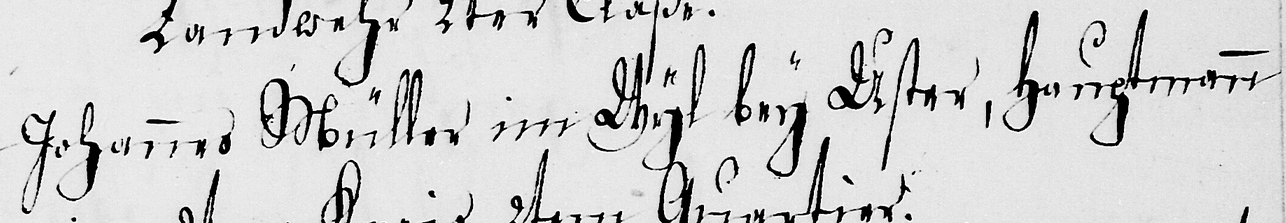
Johannes Müller im Wyl bey Uster, Hauptmann
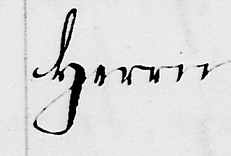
Herrn
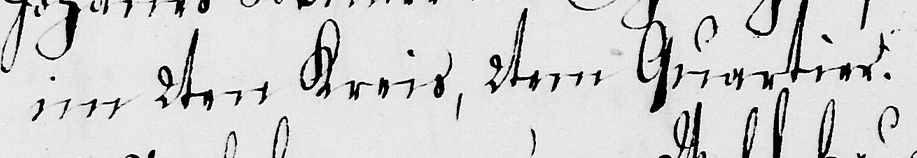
im 2ten Kreis, 2ten Quartier.
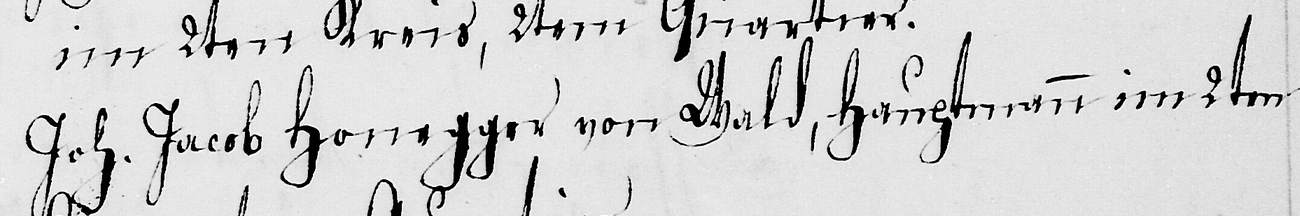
Joh. Jacob Honegger von Wald, Hauptmann im 2ten
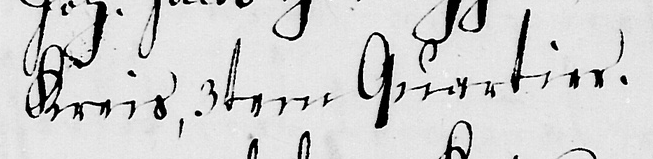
Kreis, 3ten Quartier.
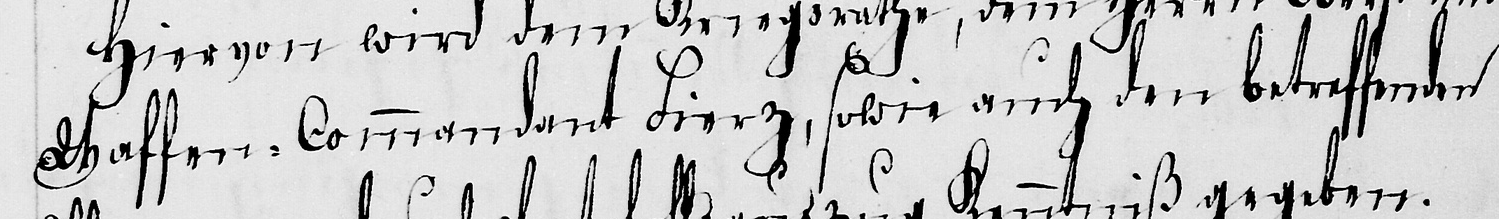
Waffen-Commandanten Fierz, sowie auch den betreffenden
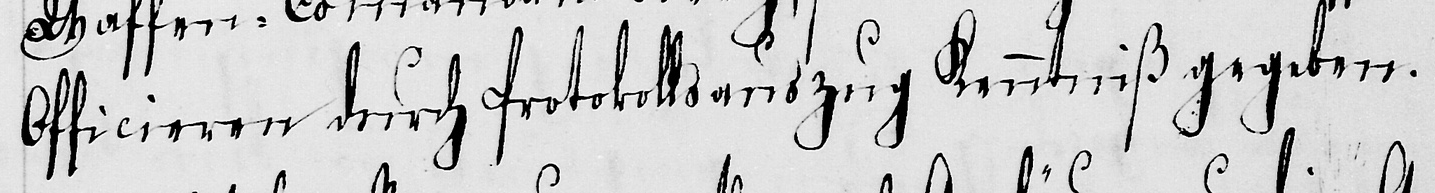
Officieren durch Protokollsauszug Kenntniß gegeben.
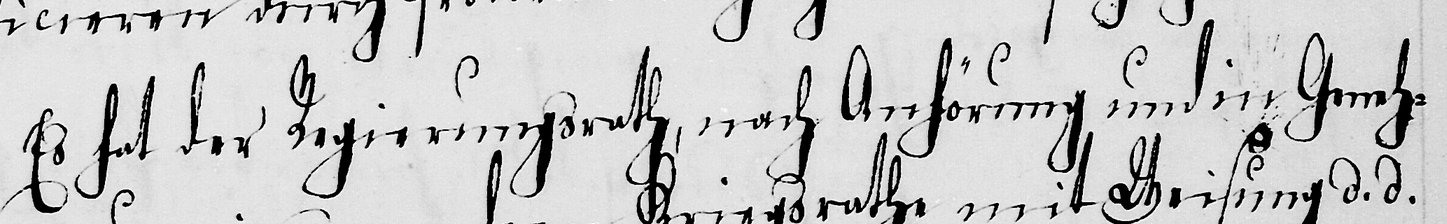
s hat der Regierungsrath, nach Anhörung und in Geneh¬
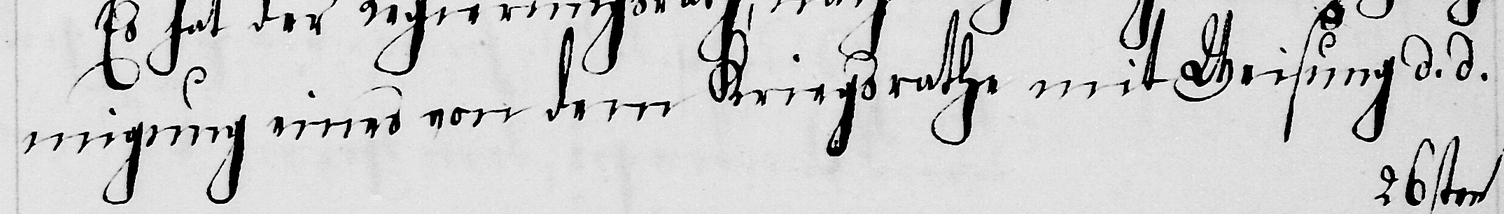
migung eines von dem Kriegsrathe mit Weisung d.d.
